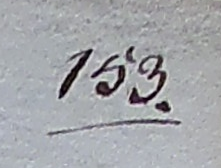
153.
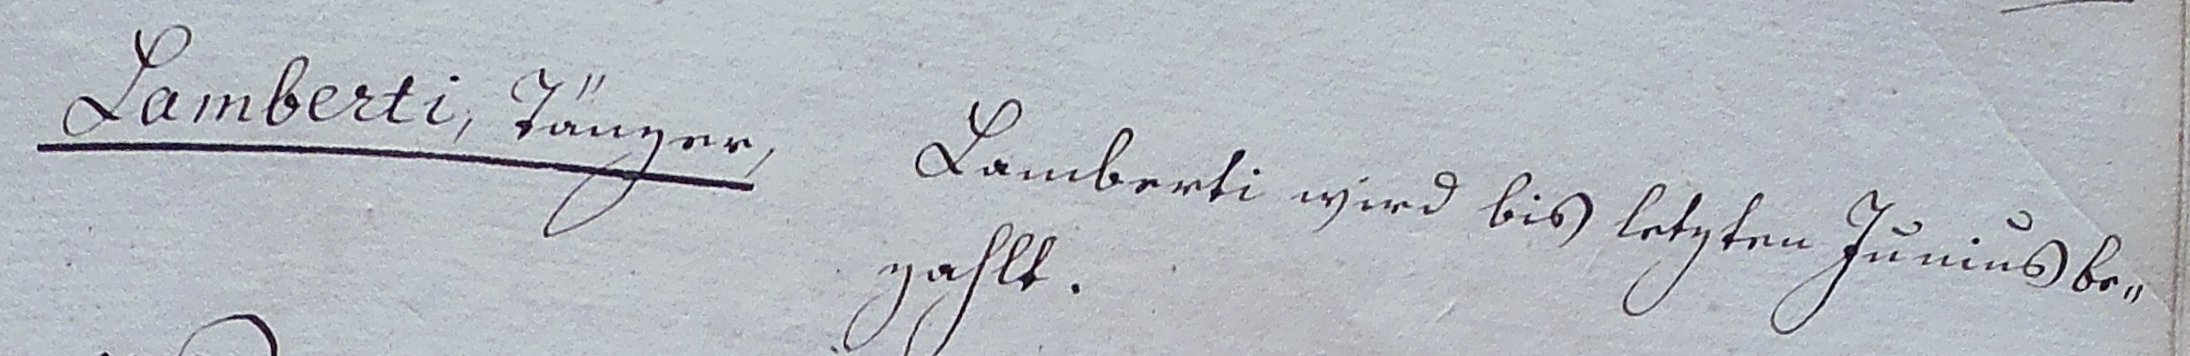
Lamberti, Tänzer, Lamberti wird bis letzten Junius be¬
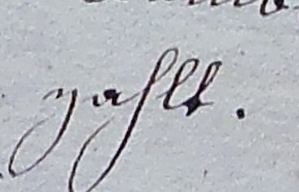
zahlt.
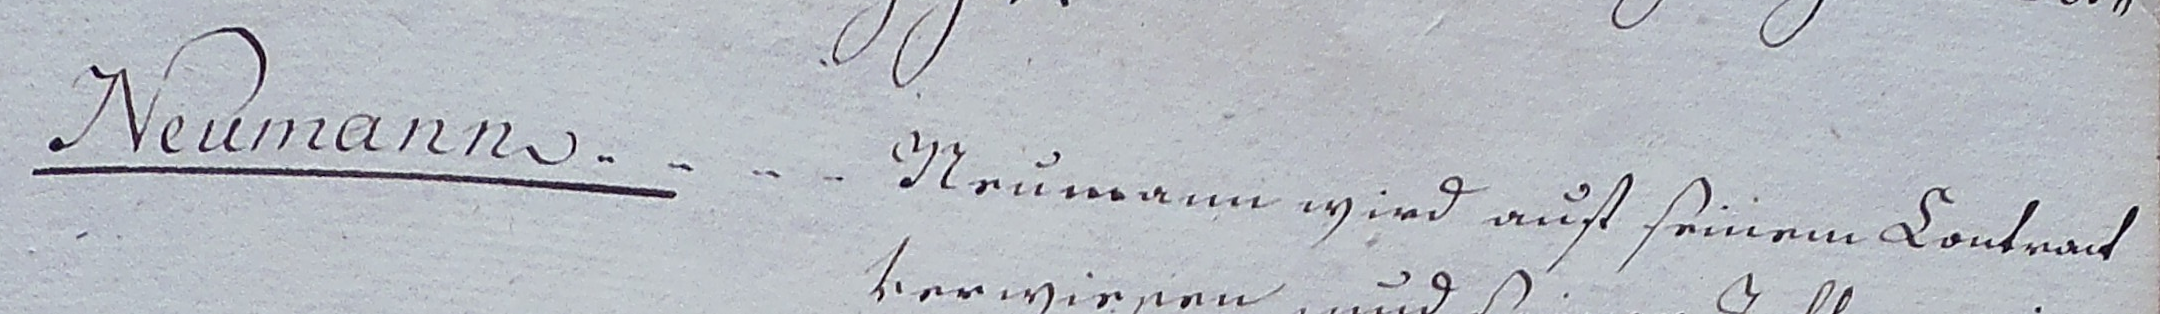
Neumann .. .. .. .. Neumann wird auf seinem Contract
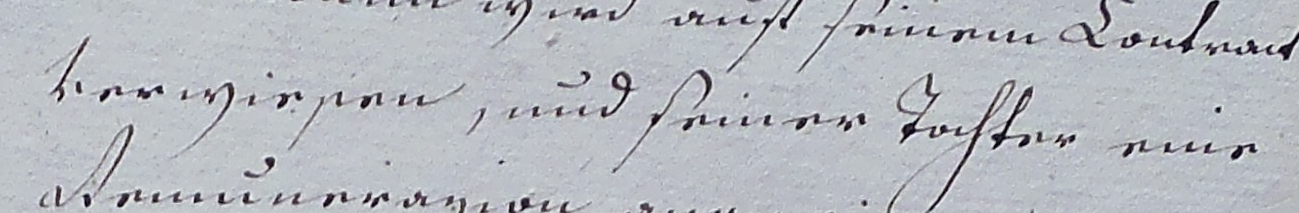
verwiesen, und seiner Tochter eine
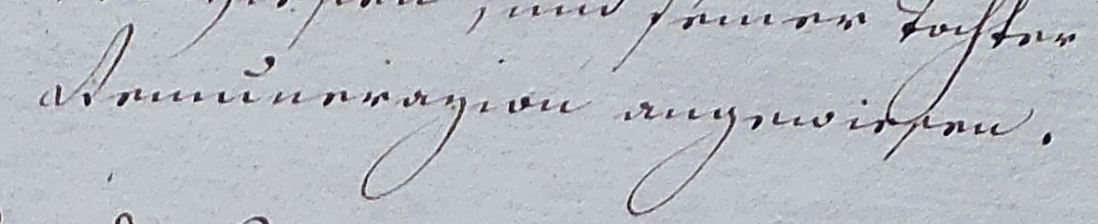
Remunerazion angewiesen.
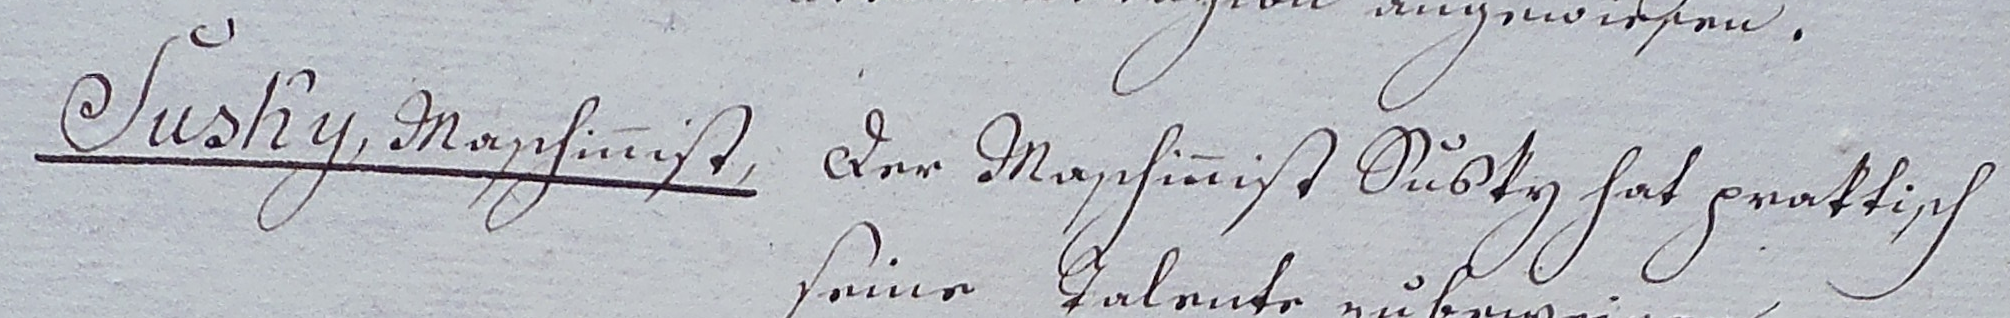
Susky, Maschinist, Der Maschinist Susky hat praktisch
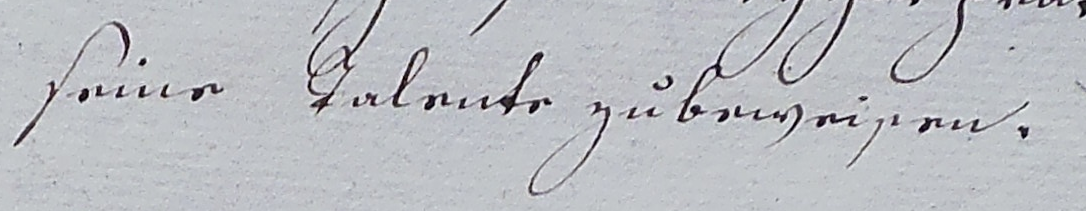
seine Talente zubeweisen.
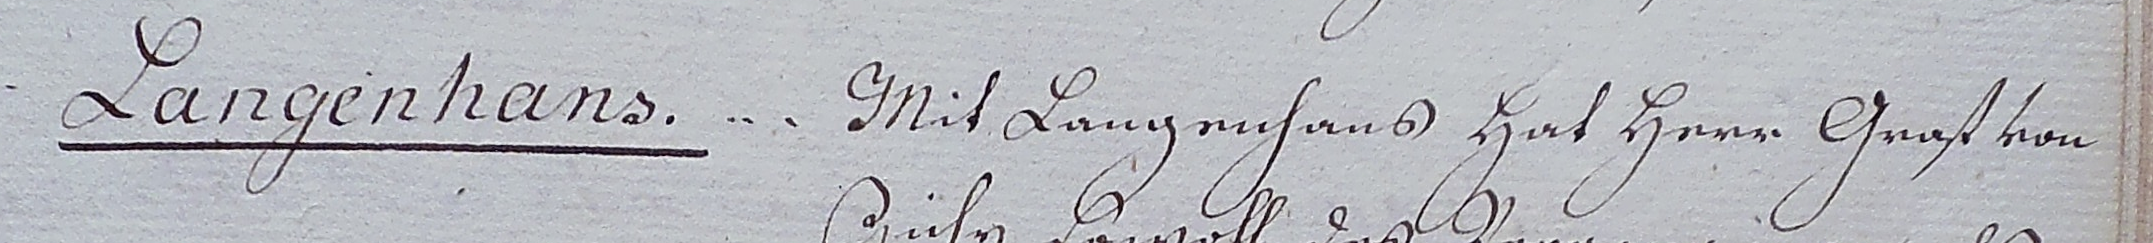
Langenhans. .. . Mit Langenhans Hat Herr Graf von
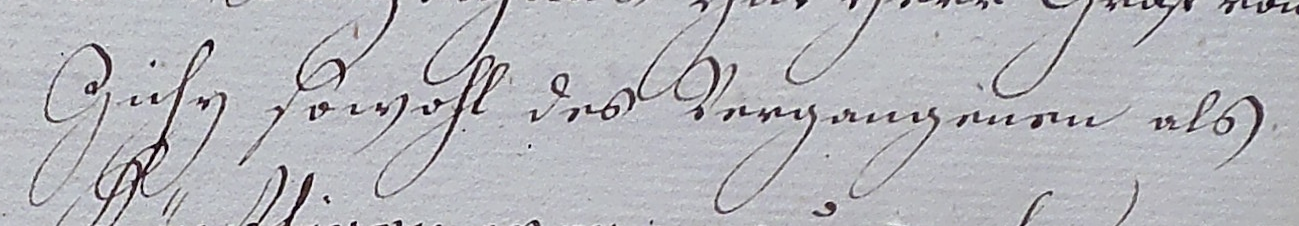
Zichy sowohl des Vergangenen als
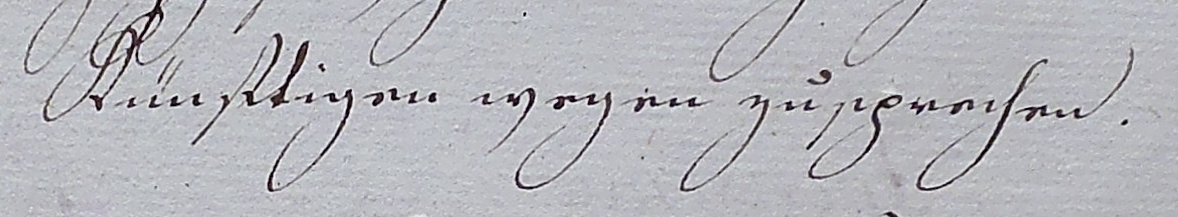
Künftigen wegen zusprechen.
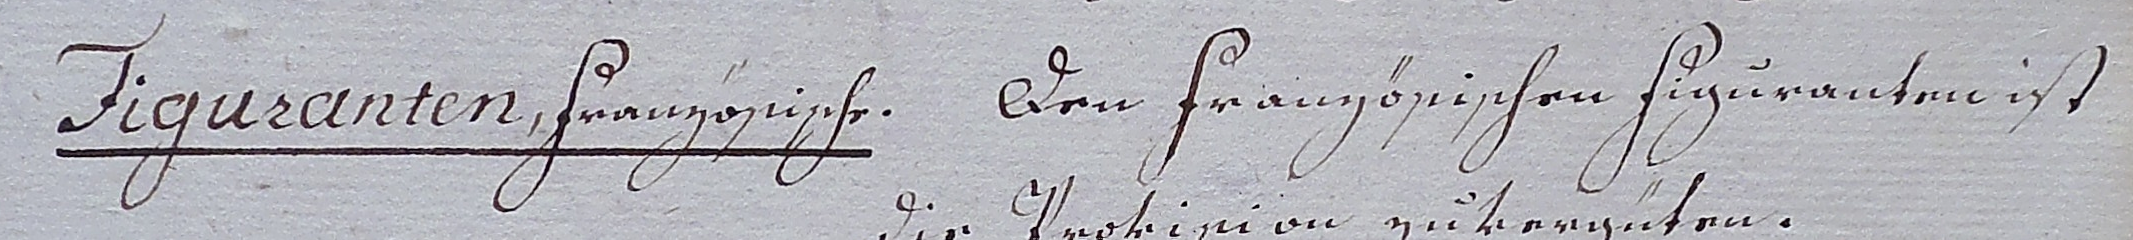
Figuranten, Französische. Den Französischen Figuranten ist
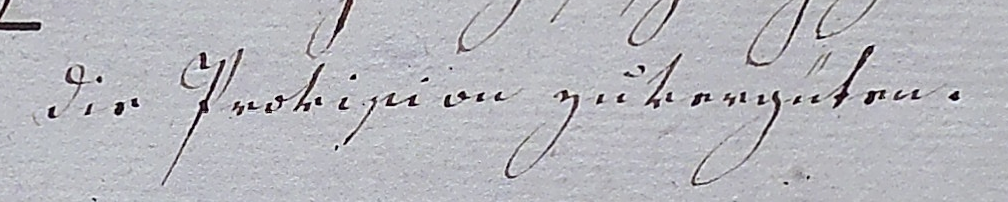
die Provision zuvergüten.
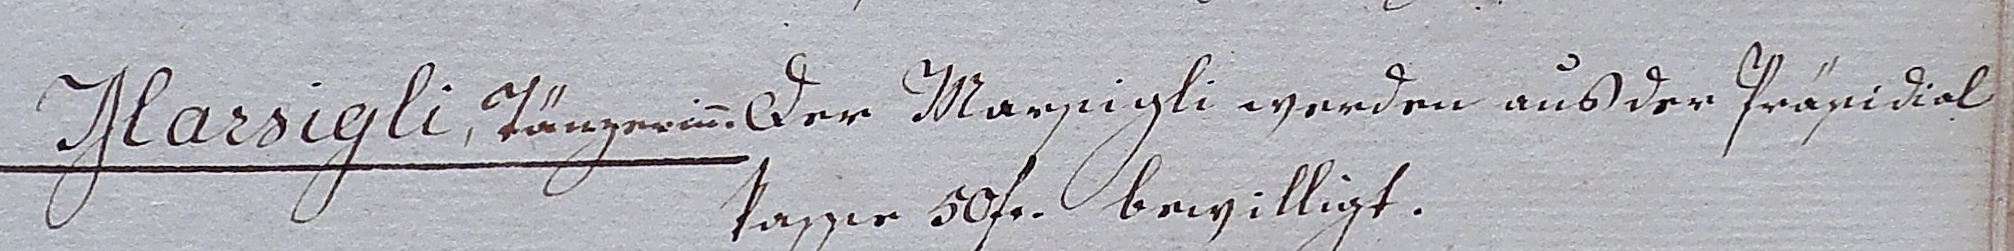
Marsigli, Tänzerin̅. Der Marsigli werden aus der Präsidial
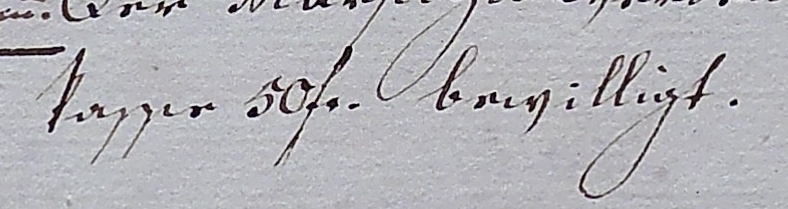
Kasse 50fr. bewilligt.
